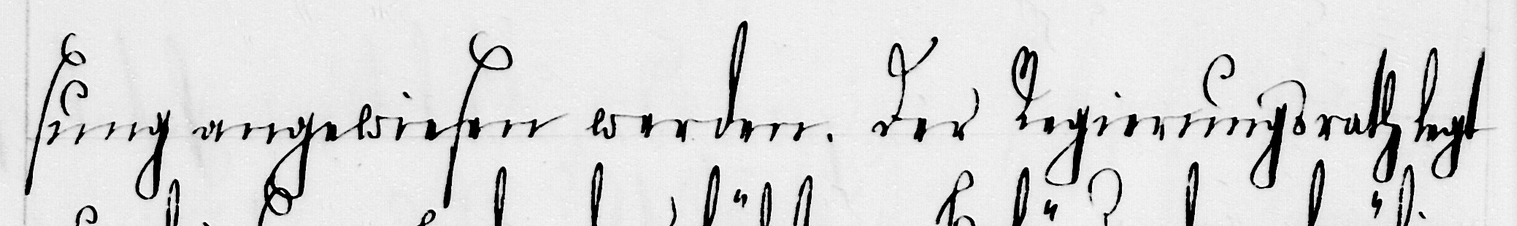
sung angewiesen werden. Der Regierungsrath legt
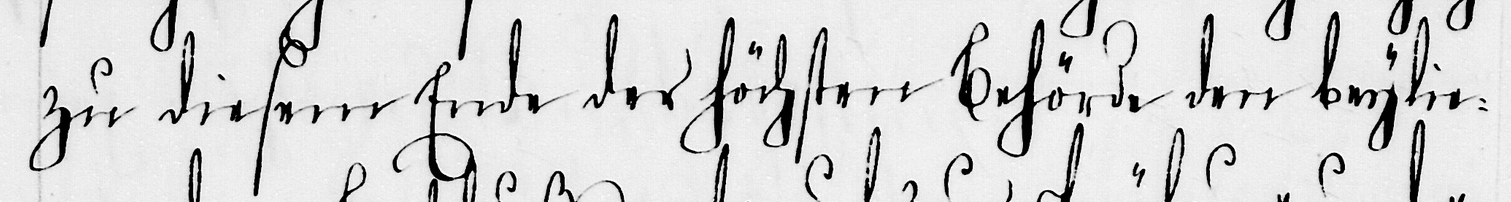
zu diesem Ende der höchsten Behörde den beylie¬
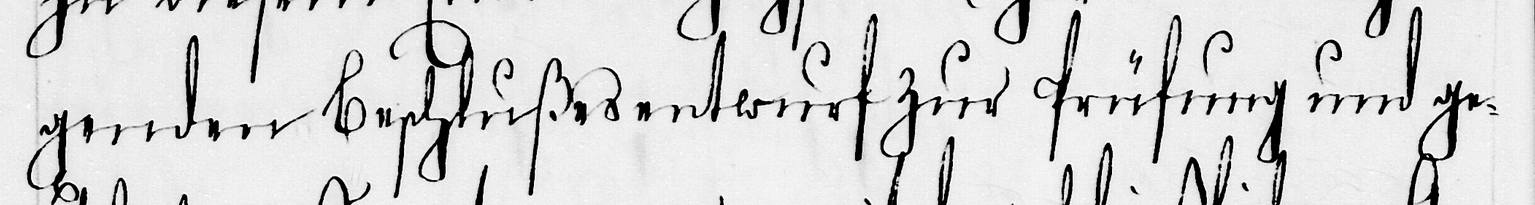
genden Beschlußesentwurf zur Prüfung und ge¬
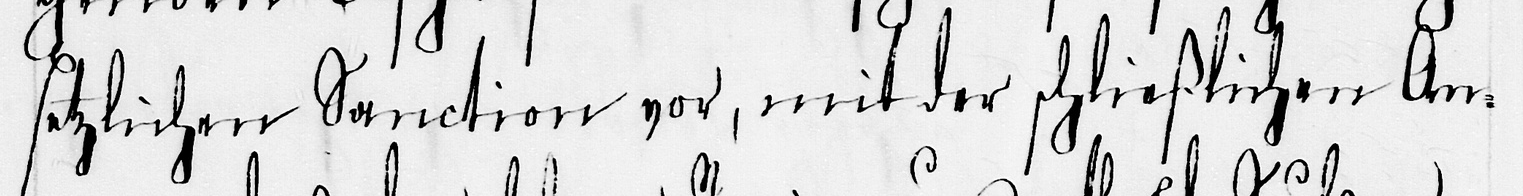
setzlichen Sanction vor, mit der schließlichen An¬
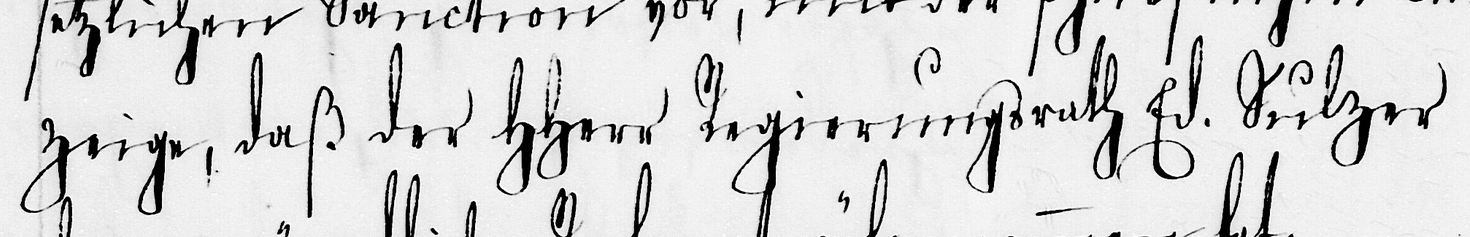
zeige, daß der HHerr Regierungsrath Ed. Sulzer
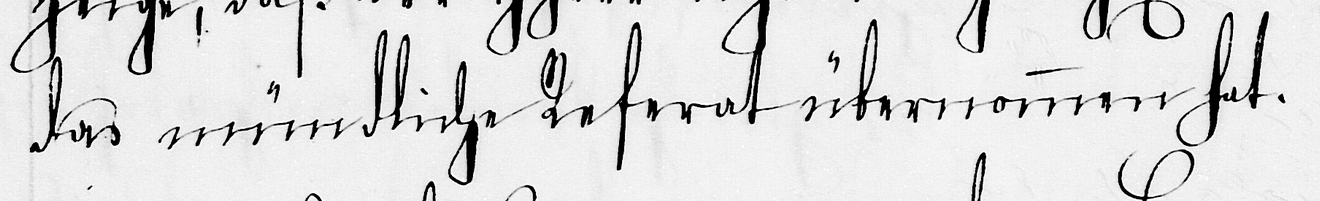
das mündliche Referat übernommen hat.
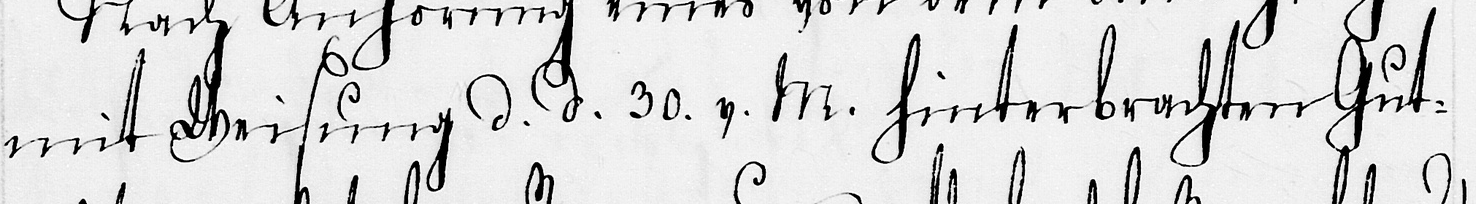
mit Weisung d. d. 30. v. M. hinterbrachten Gut¬
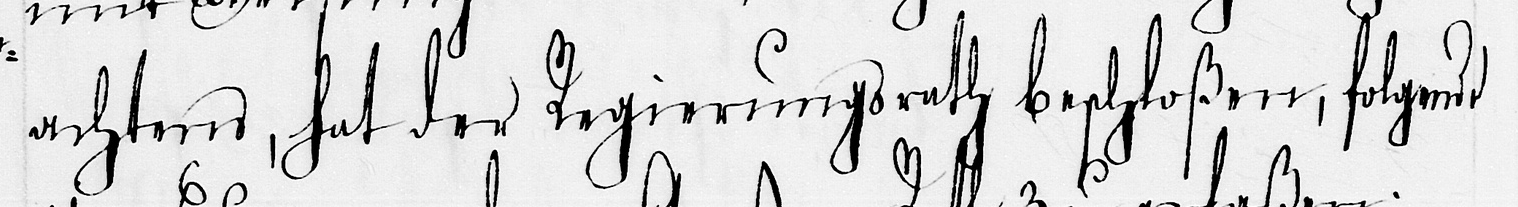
achtens, hat der Regierungsrath beschloßen, folgende
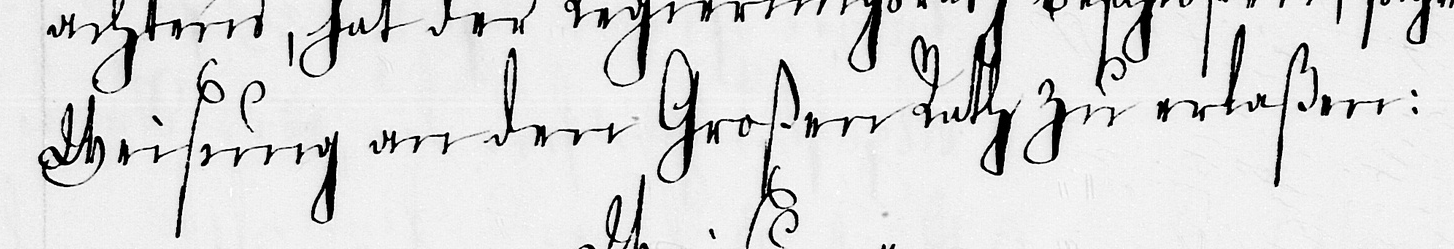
Weisung an den Großen Rath zu erlaßen:
